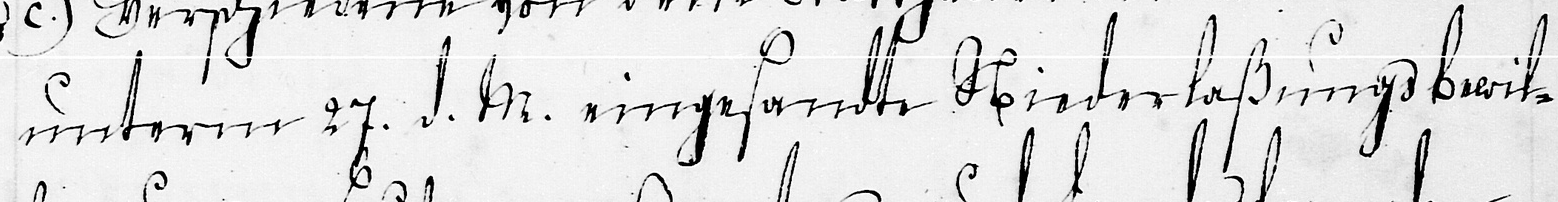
unterm 27. d. M. eingesandte Niederlaßungsbewil¬
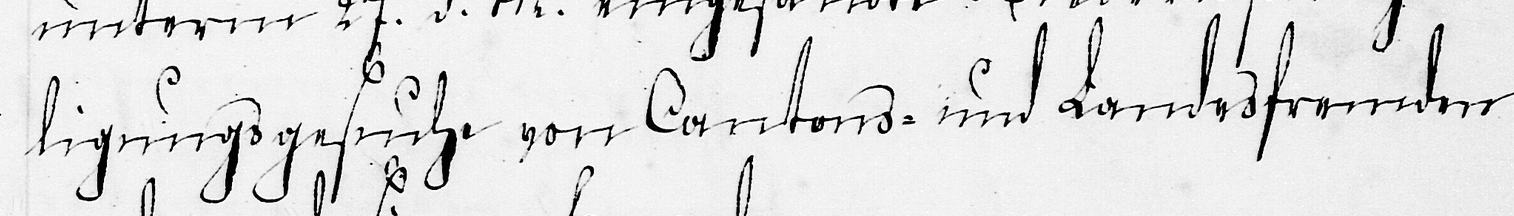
ligungsgesuche von Cantons- und Landesfremden
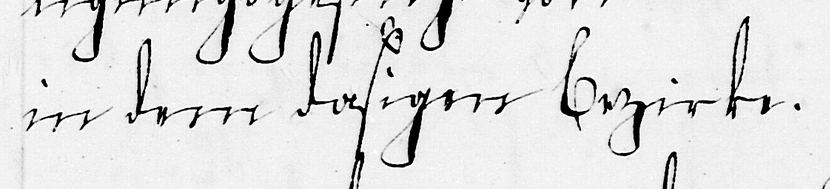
in dem dasigen Bezirke.
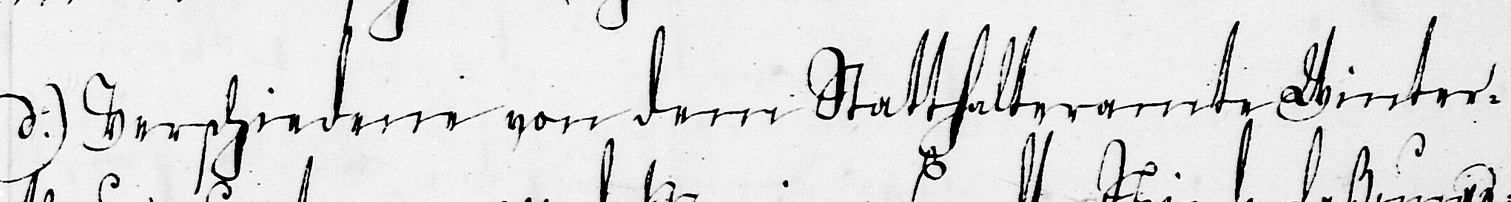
d.) Verschiedene von dem Statthalteramte Winter¬
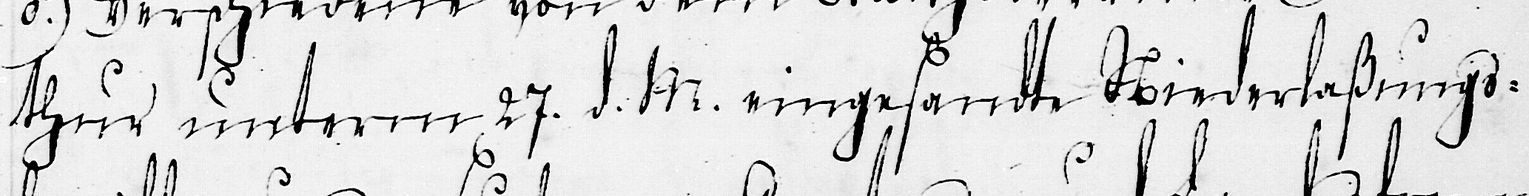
thur unterm 27. d. M. eingesandte Niederlaßungs¬
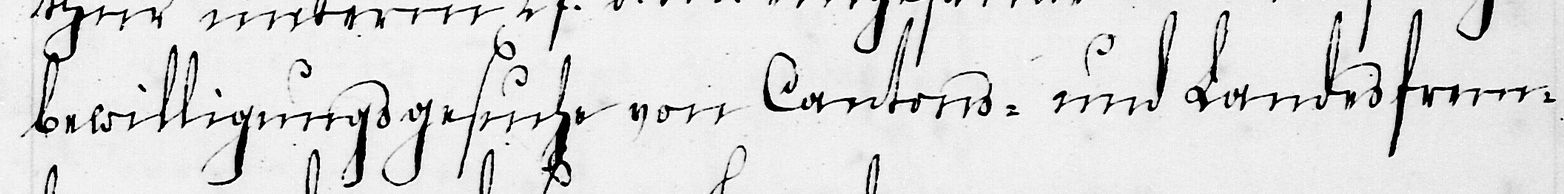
bewilligungsgesuche von Cantons- und Landesfrem¬
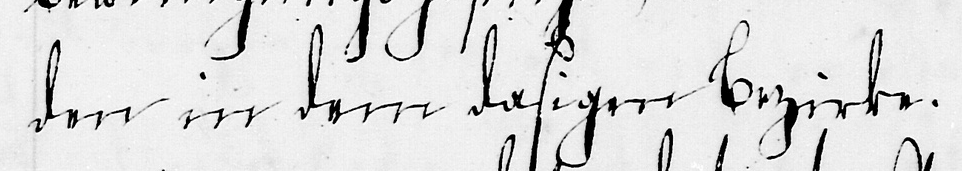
den in dem dasigen Bezirke.
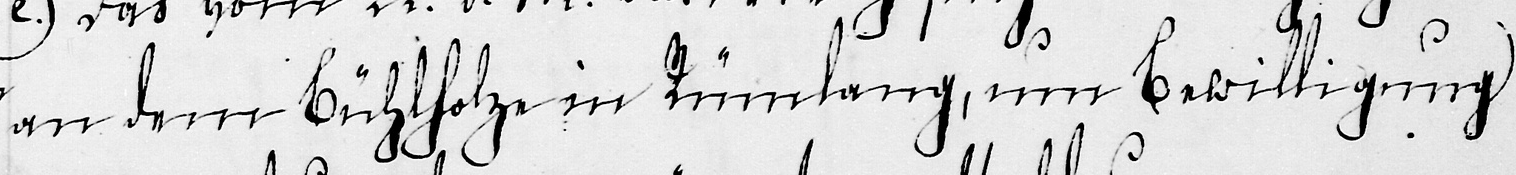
an dem Bühlholze in Rümlang, um Bewilligung
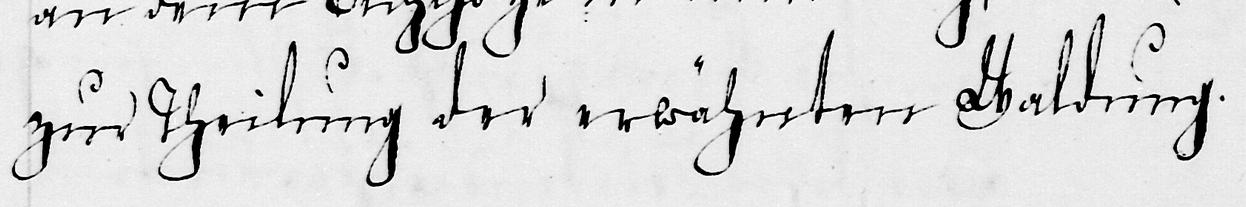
zur Theilung der erwähnten Waldung.
